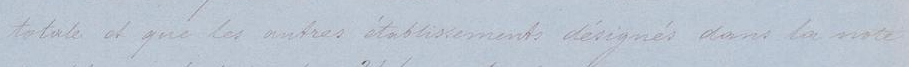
totale et que les autres établissements désignés dans la note
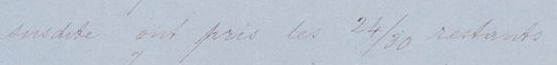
susdite ont pris les 24/30 restants.
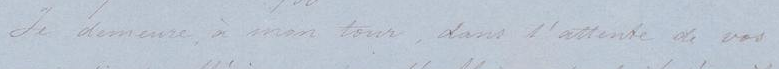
Je demeure, à mon tour, dans l'attente de vos
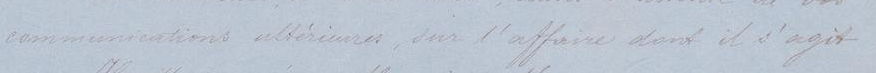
communications ultérieures, sur l'affaire dont il s'agit.
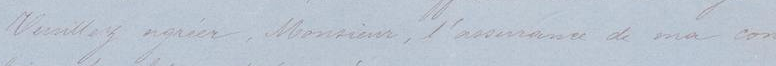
Veuillez agréer, Monsieur, l'assurance de ma con-
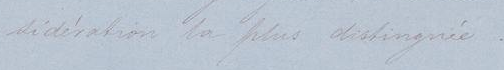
sidération la plus distinguée.
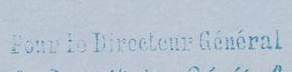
Pour le Directeur Général
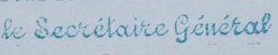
Le Secrétaire Général
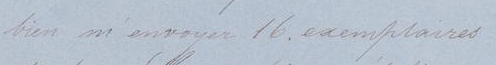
bien m'envoyer 16. exemplaires
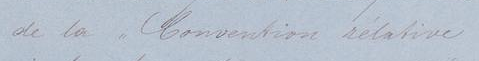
de la «Convention rélative
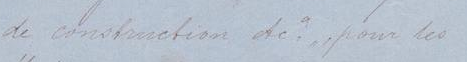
de construction etc:», pour les
